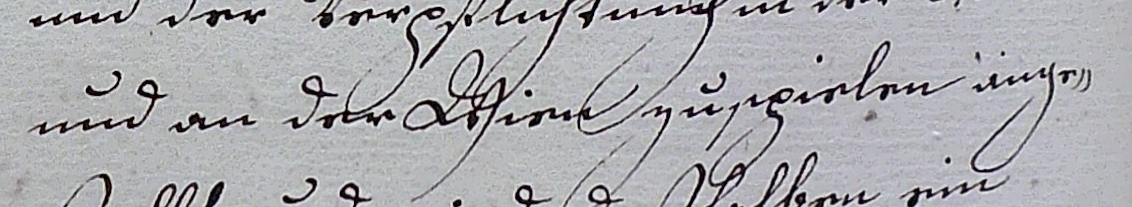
und an der Wien zuspielen ange¬
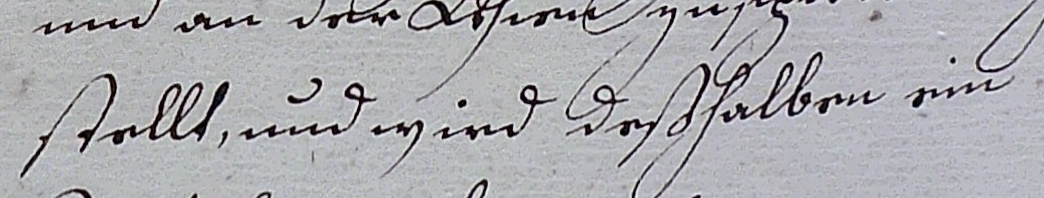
stellt, und wird deßhalben ein
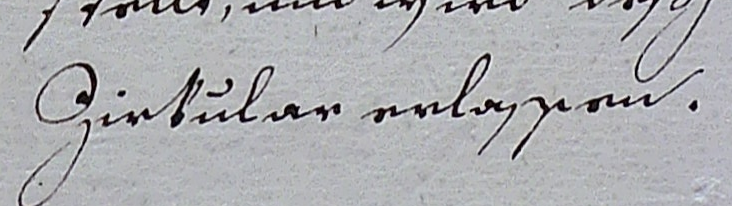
Zirkular erlassen.
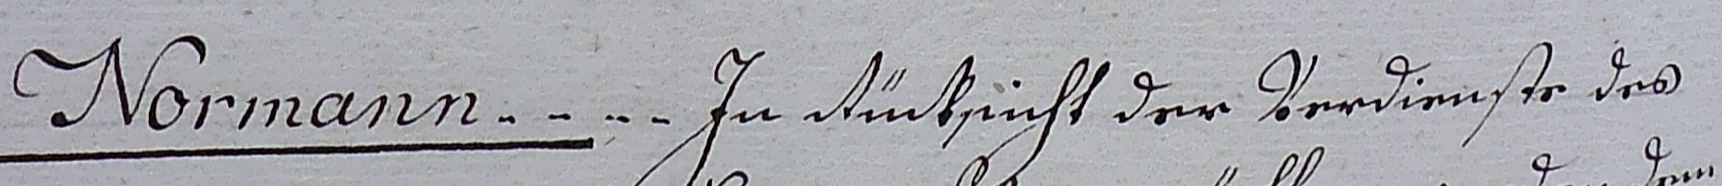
Normann .. .. .. .. In Rücksicht der Verdienste des
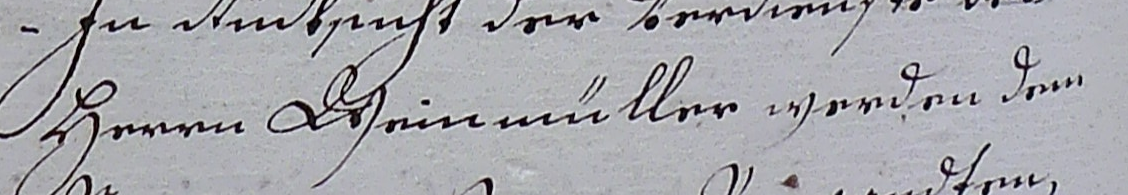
Herrn Weinmüller werden dem
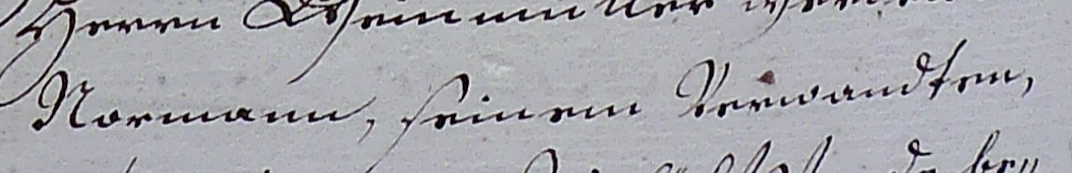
Normann, seinem Verwandten,
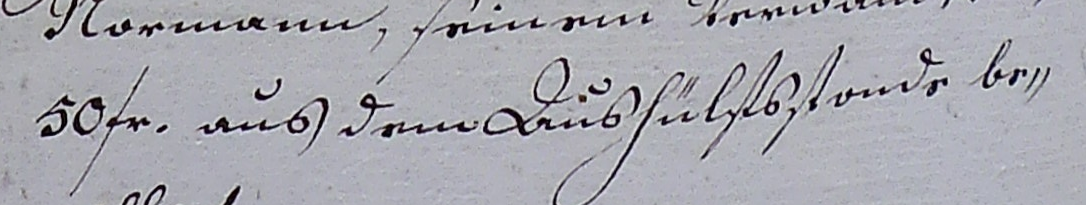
50fr. aus dem Aushülfsfonde be¬
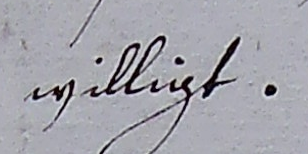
willigt.
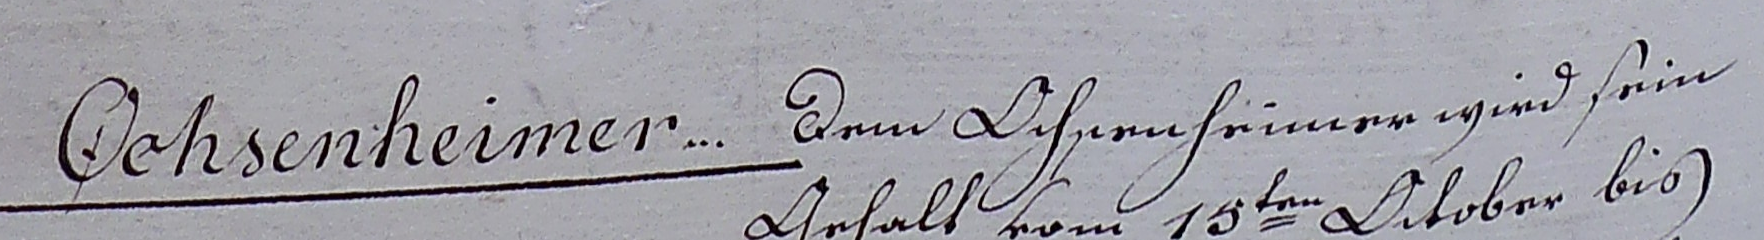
Ochsenheimer ... Dem Ochsenheimer wird sein
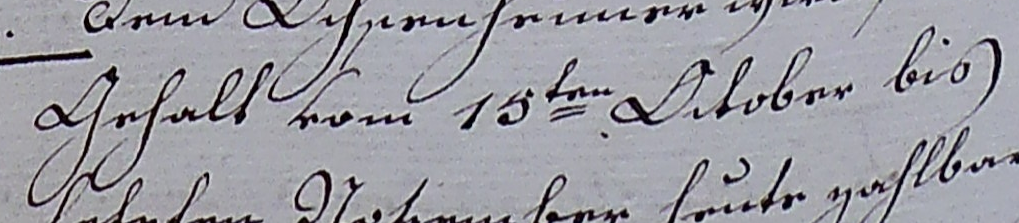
Gehalt vom 15te͇n October bis
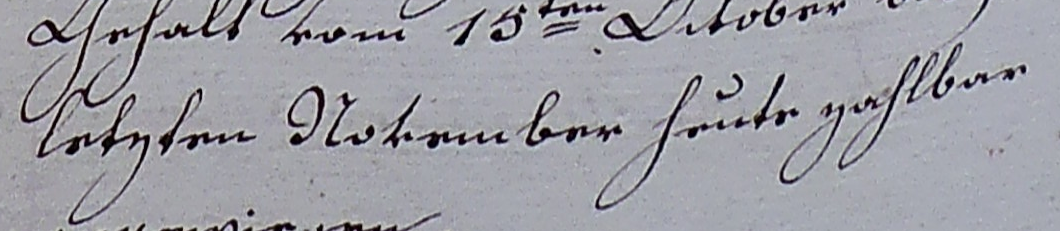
letzten November heute zahlbar
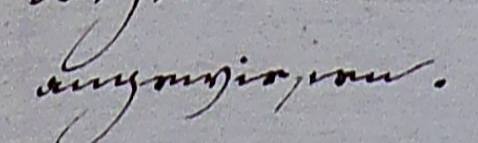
angewiesen.
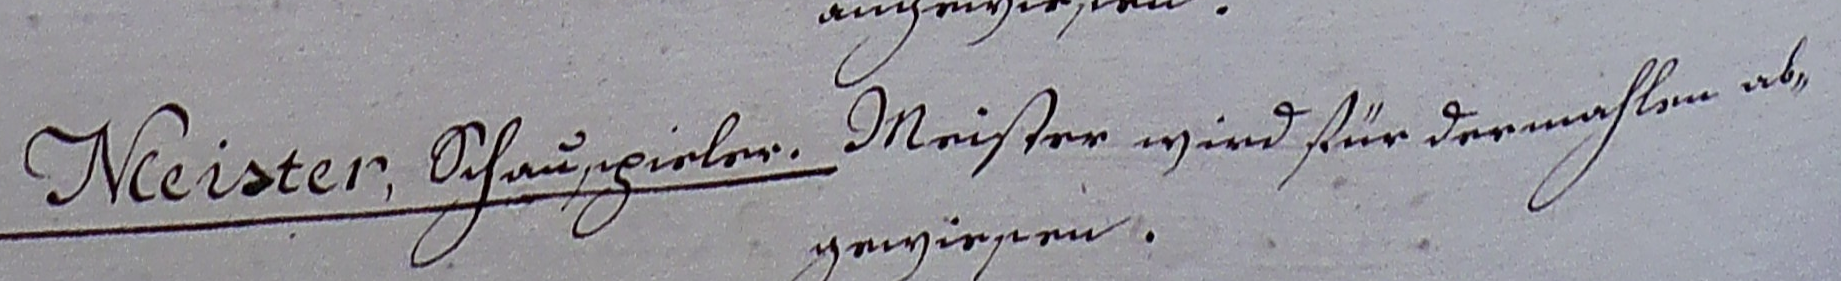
Meister, Schauspieler. Meister wird für dermahlen ab¬
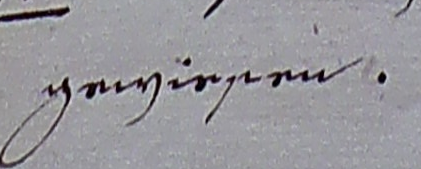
gewiesen.
